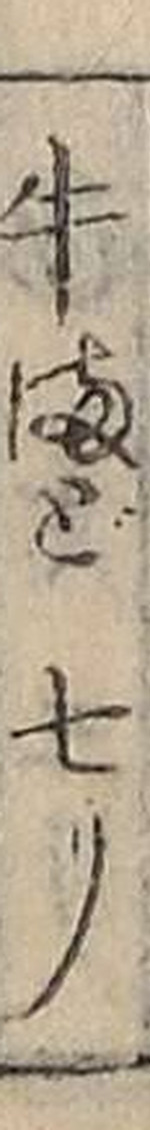牛まど七リ

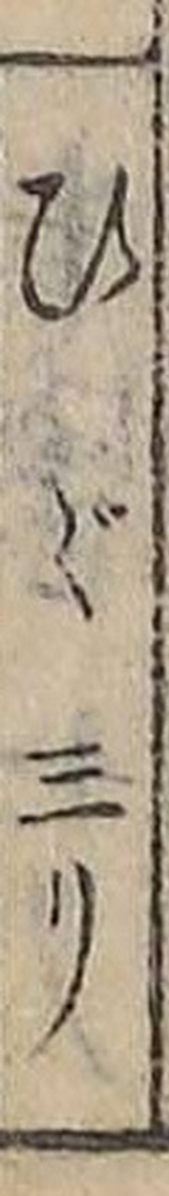ひゞ三リ
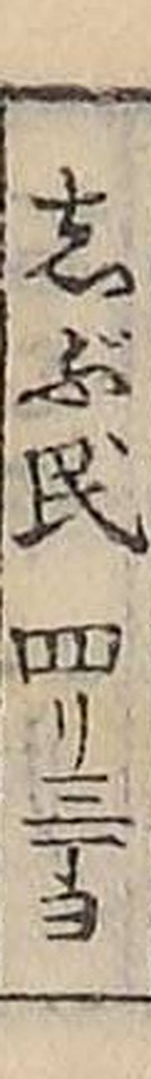しぶ民四リ三丁ヨ
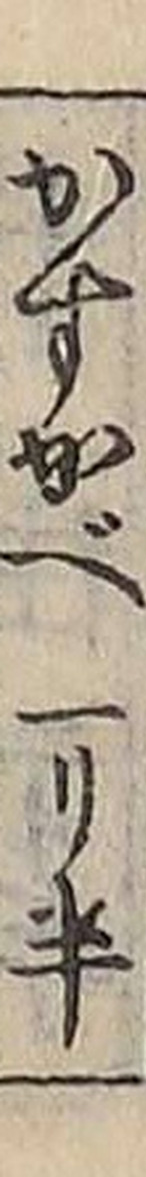かすかべ一リ半
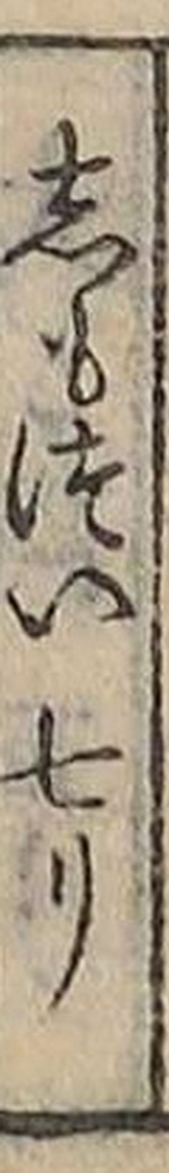しもつい七リ
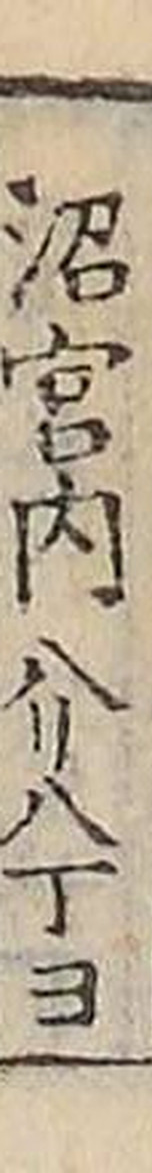沼宮内八リ八丁ヨ
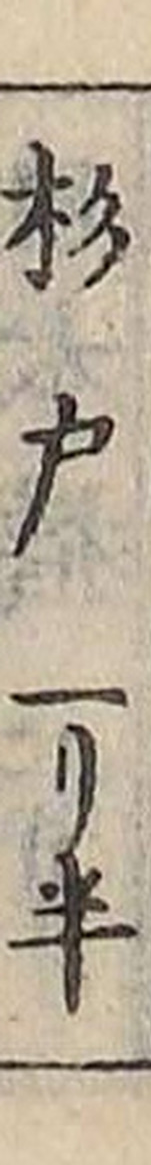杉戸一リ半
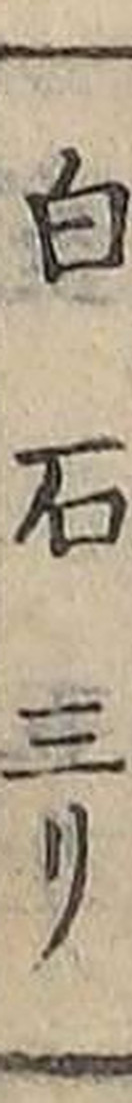白石三リ
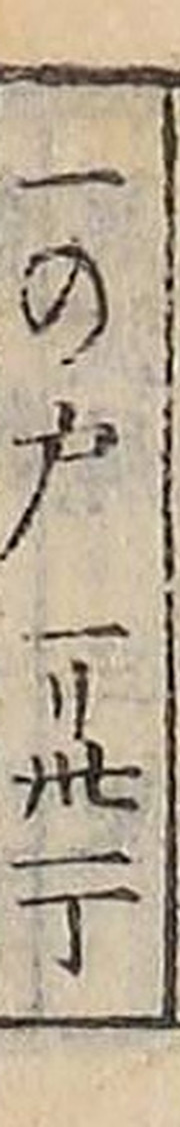一の戸一リ卅一丁
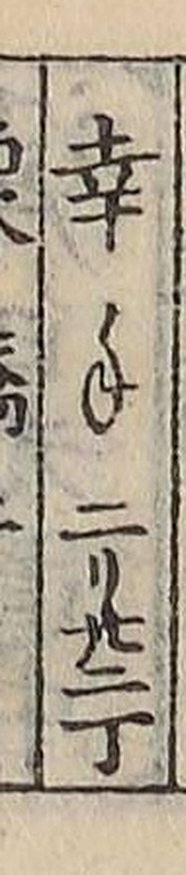幸手二リ廿二丁
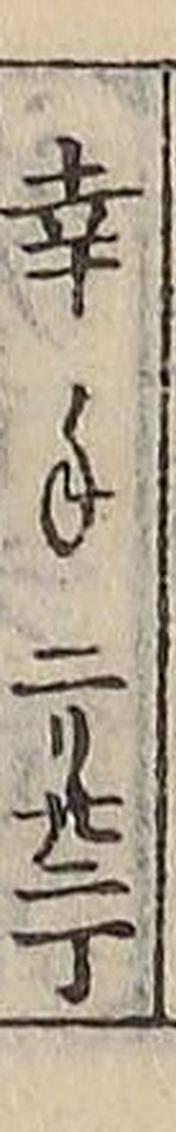幸手二リ廿二丁
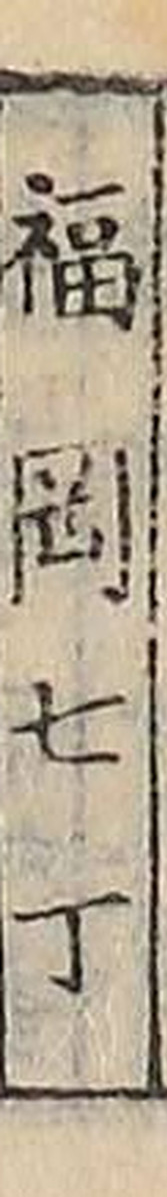福岡七丁
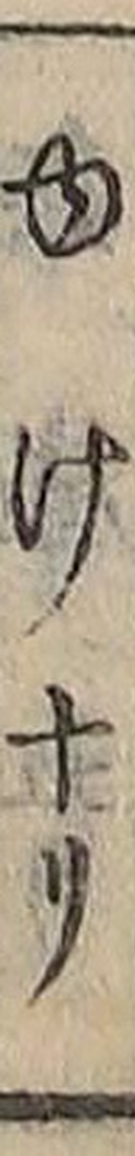ゆけ十リ
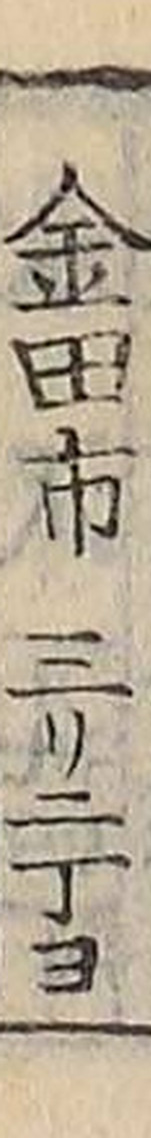金田市三リ二丁ヨ
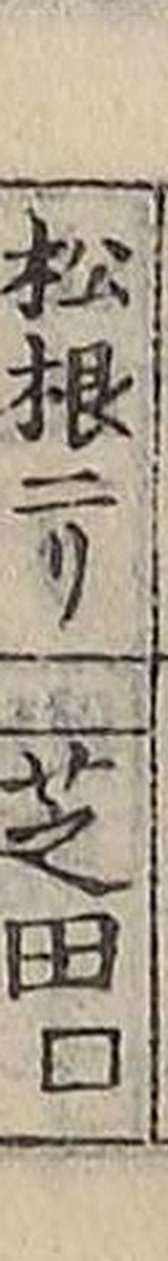松根二リ芝田▫
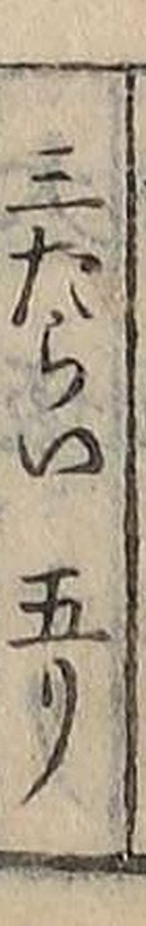みたらい五リ
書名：旅行用心集
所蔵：神戸大学附属図書館 国文学研究資料館
